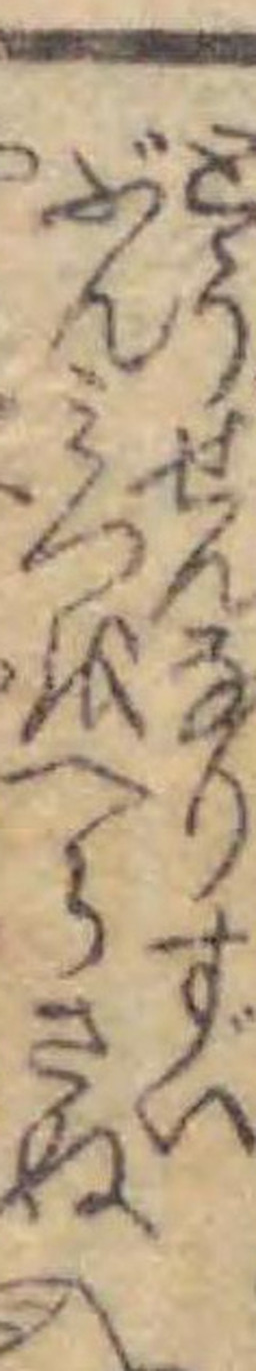ぶんみつをへらさぬ
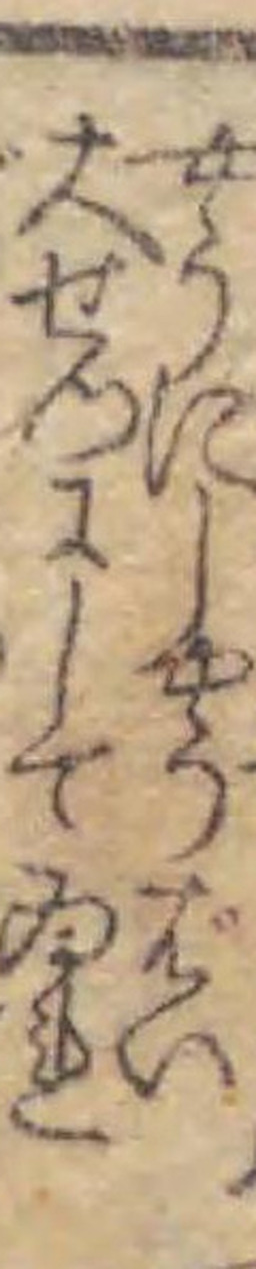大せつにしてゐれ
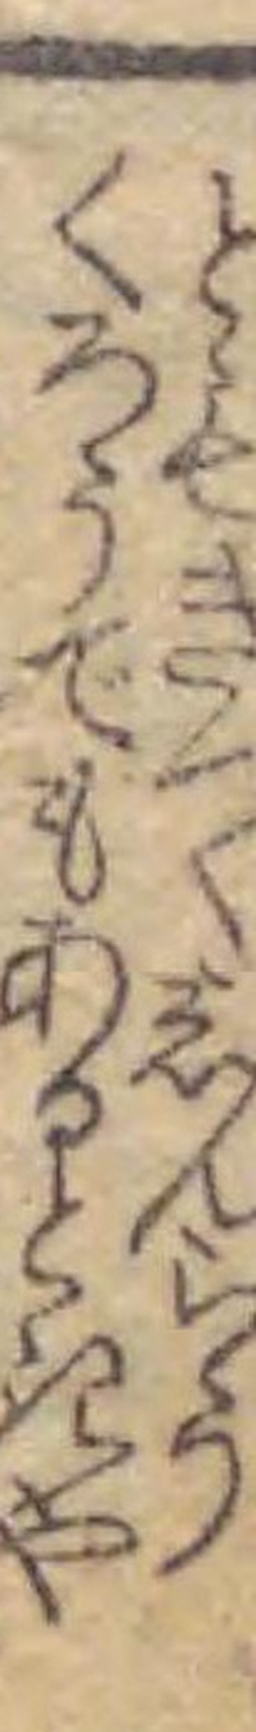くろうでもあるときや
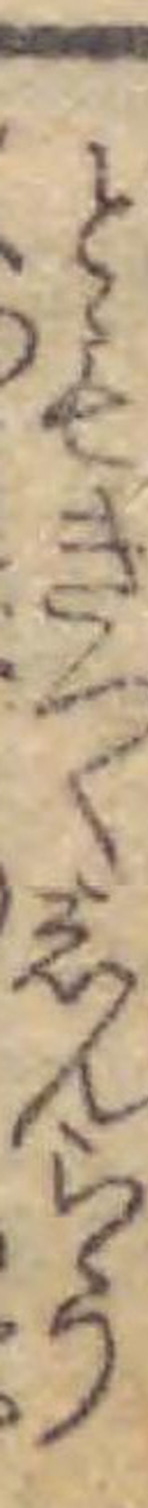どもきつくしんらう
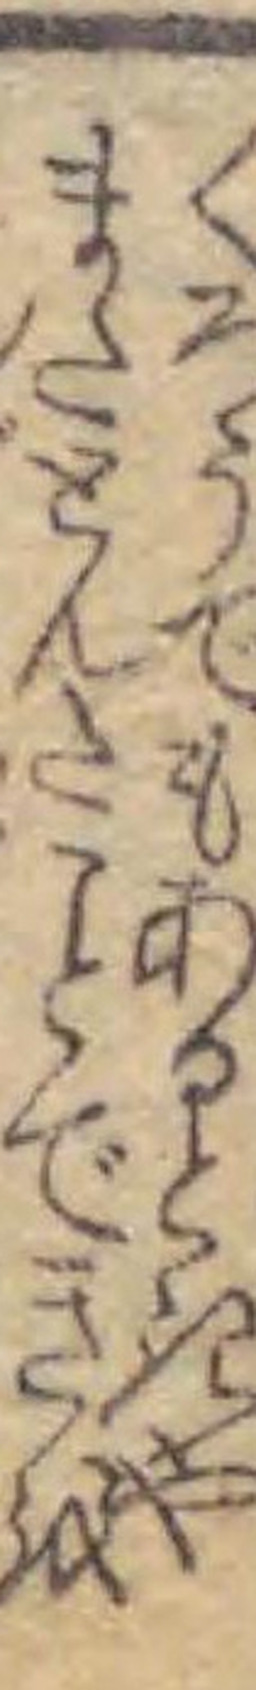またとんたことできを
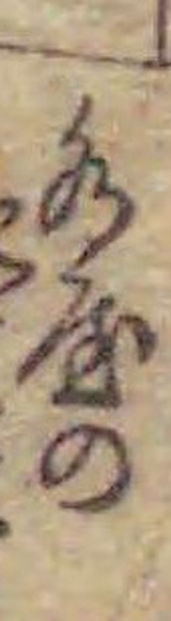水屋の
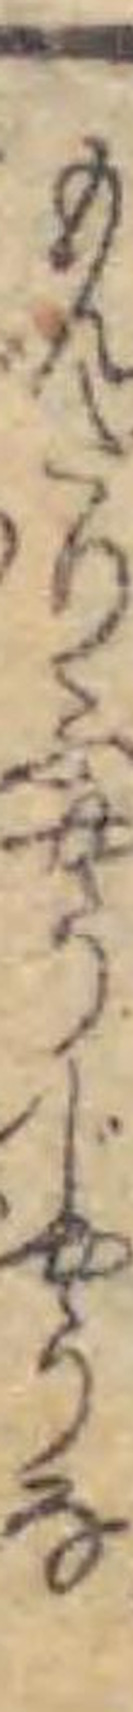もんだりふやうじやうな
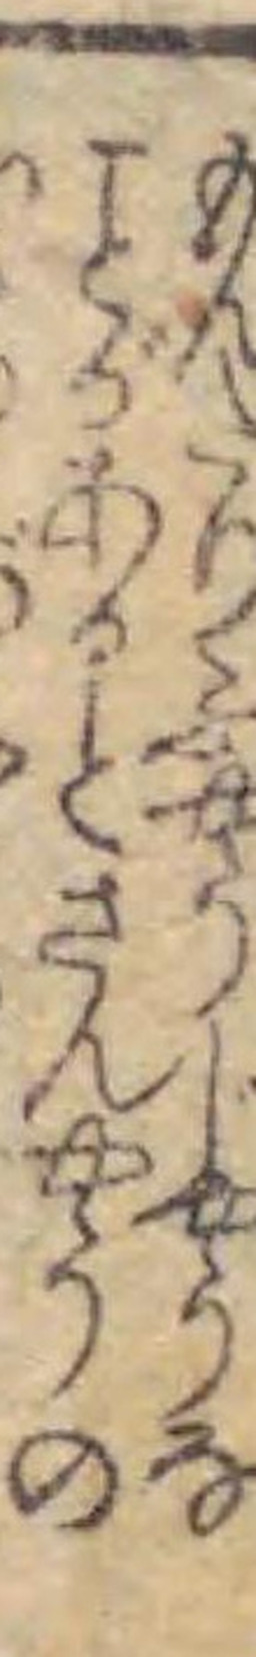ことがあるとさんやうの
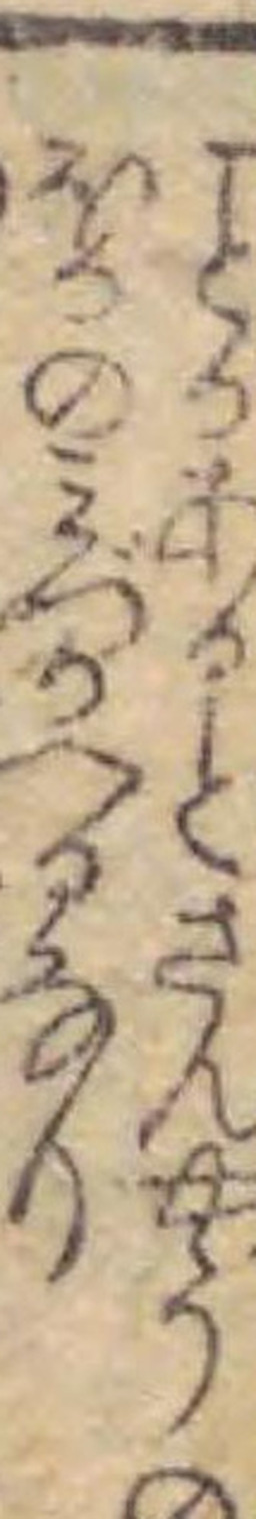ほかのみづかへるなり
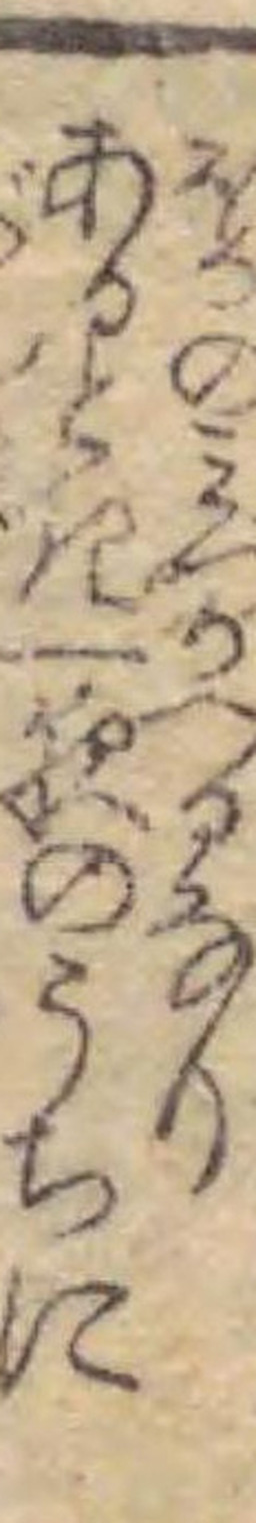あるとき一夜のうちに
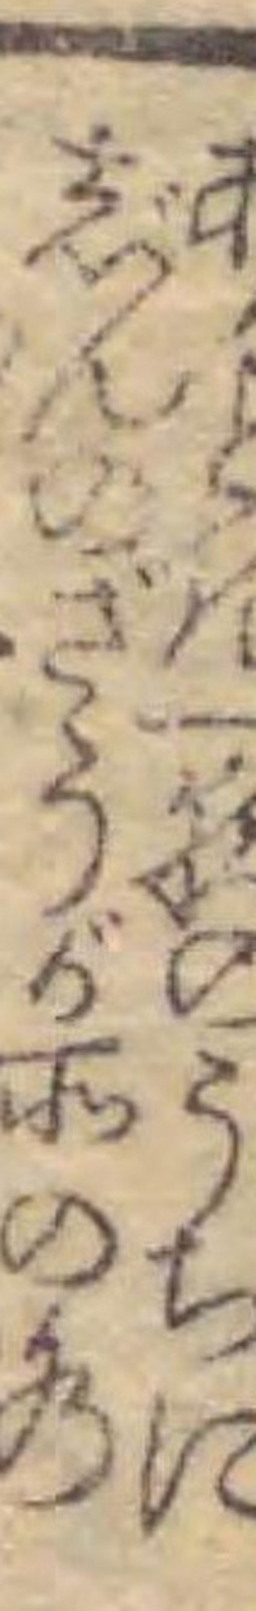じんのざうが所の水
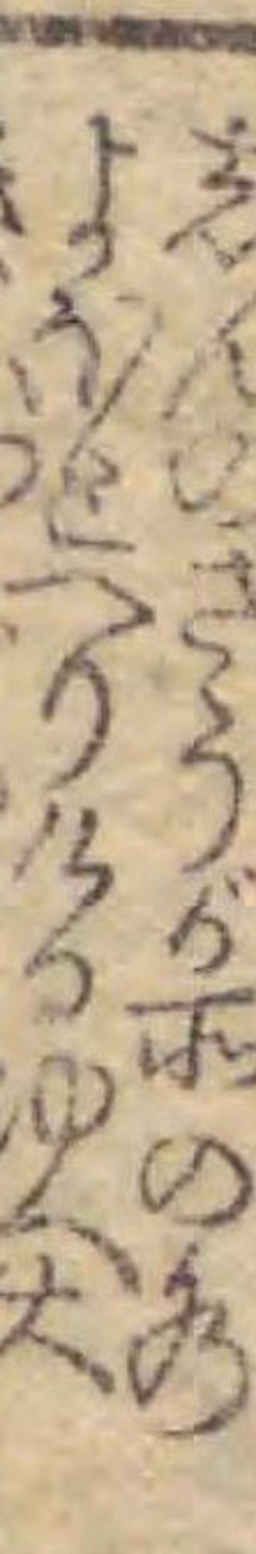よほとへりけるゆへ大
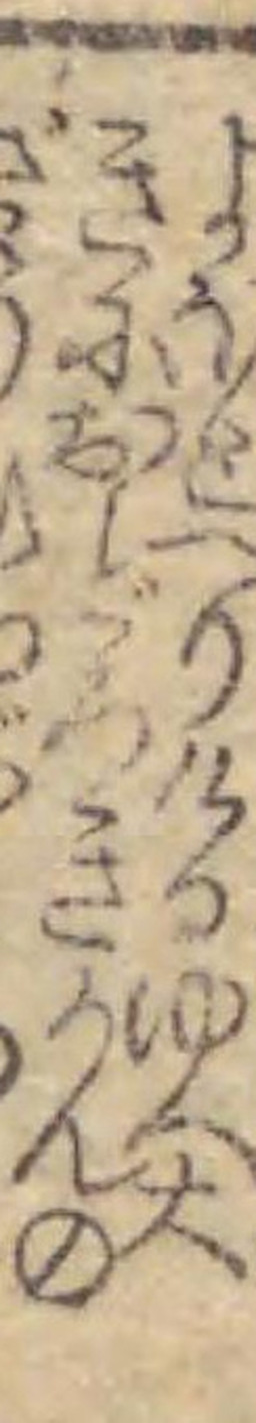きにおどろきかんの
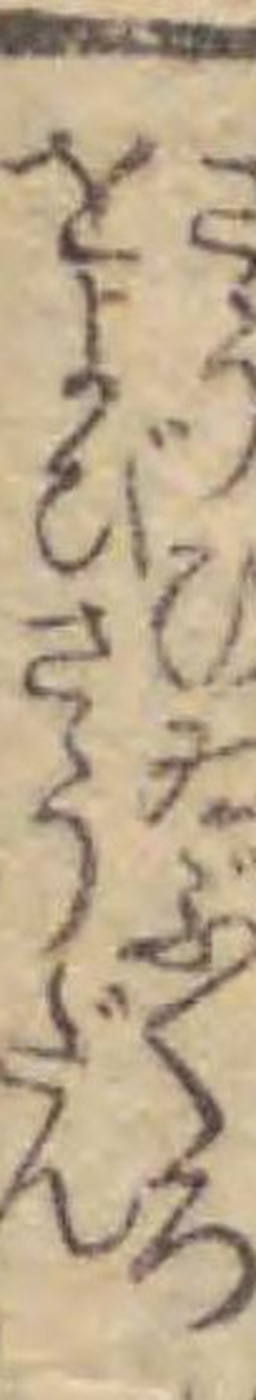をよびさうだん
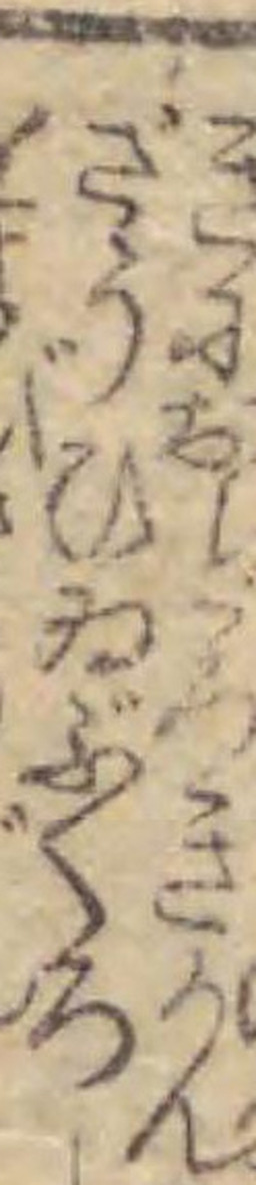ざうひゐぶくろ
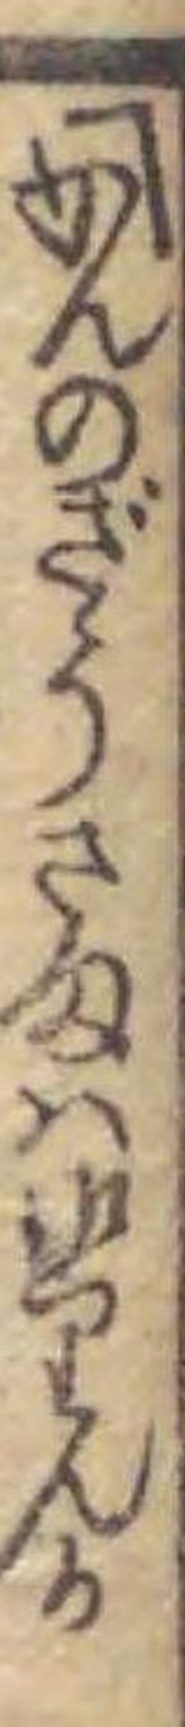〽かんのざうさまは御りんか
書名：十四傾城腹之内 : 3巻
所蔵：国立国会図書館 National Diet Library, JAPAN
